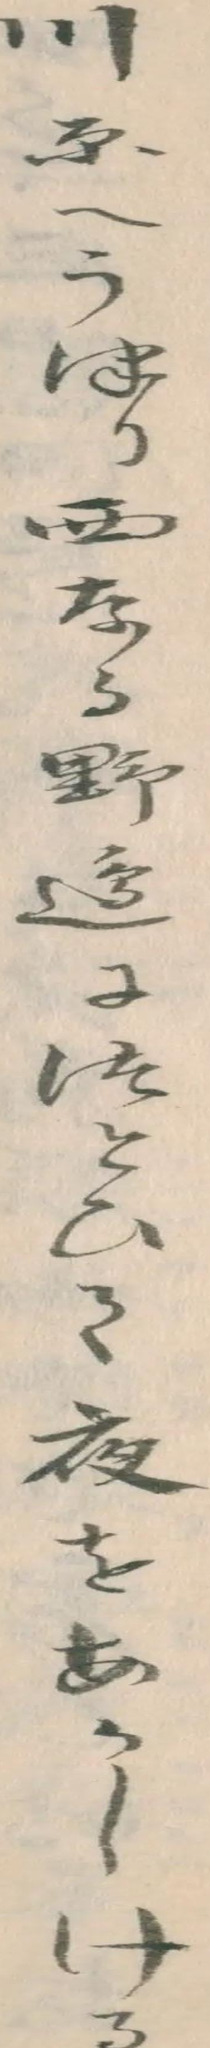川原へうつり西なる野辺につどひて夜をあかしける

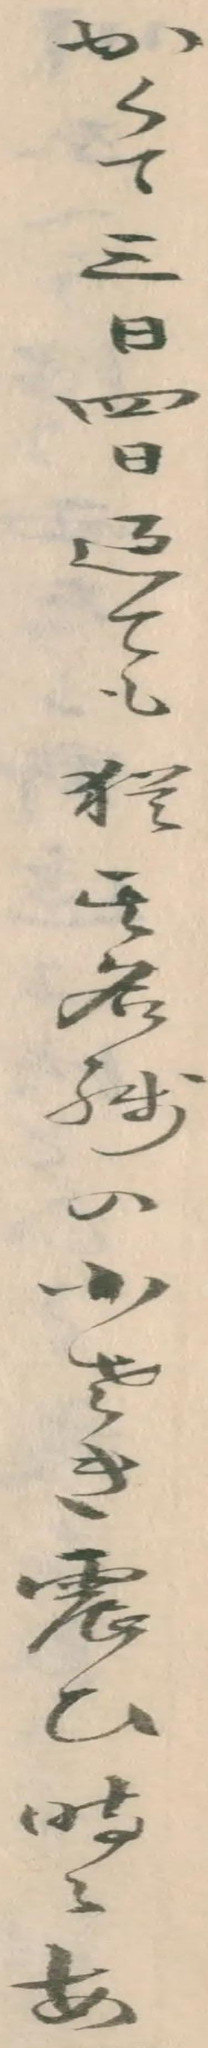かくて三日四日過ても猶其名残の小さき震ひ時々あ
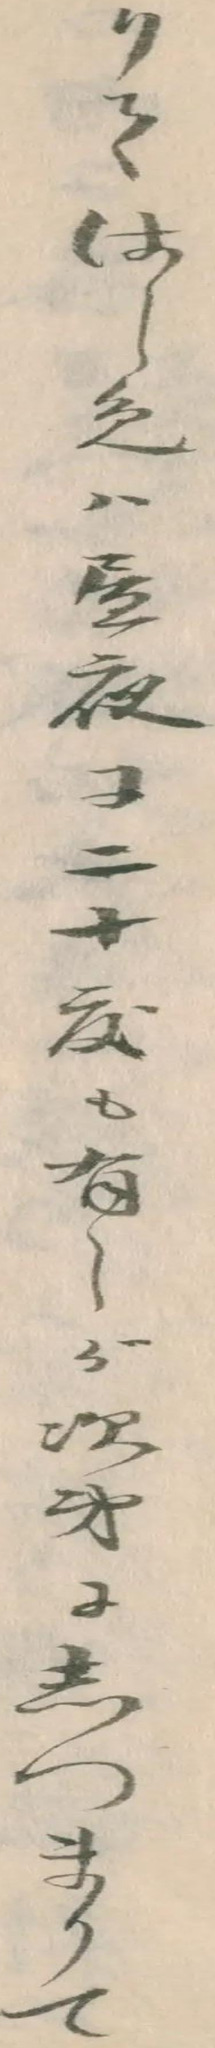りてはしめは昼夜に二十度も有しが次第にしつまりて
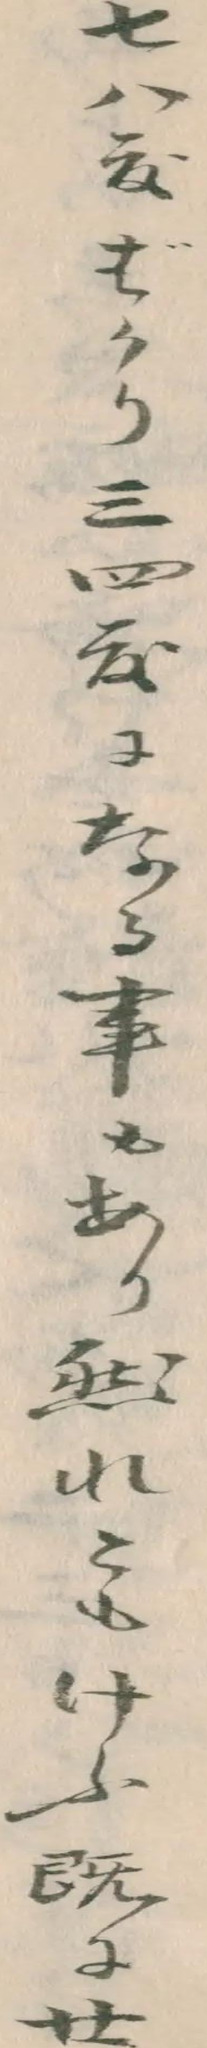七八度ばかり三四度になる事もあり然れともけふ既に廿
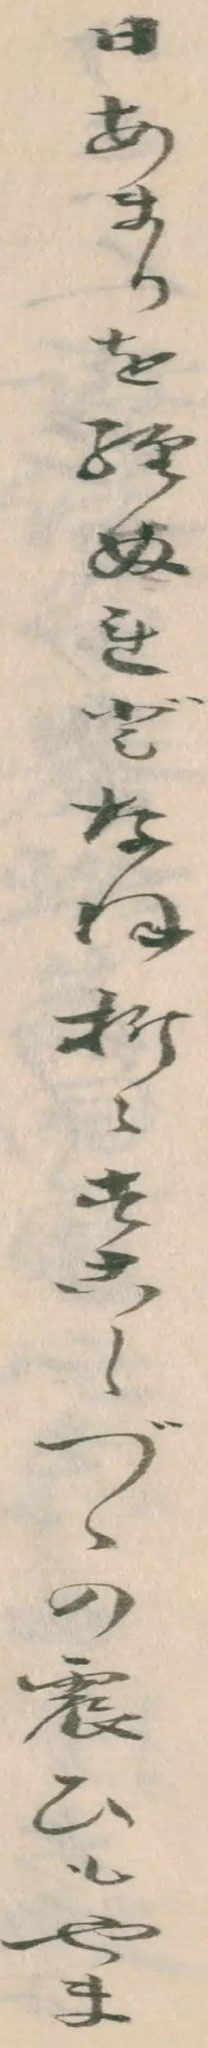日あまりを経ぬれどなほ折々すこしづゝの震ひもやま
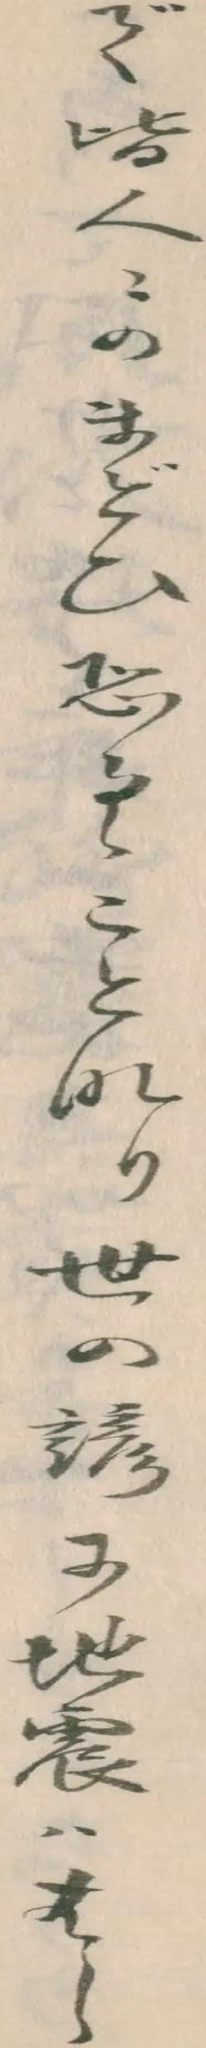で皆人々のまどひ恐るゝことなり世の諺に地震ははし
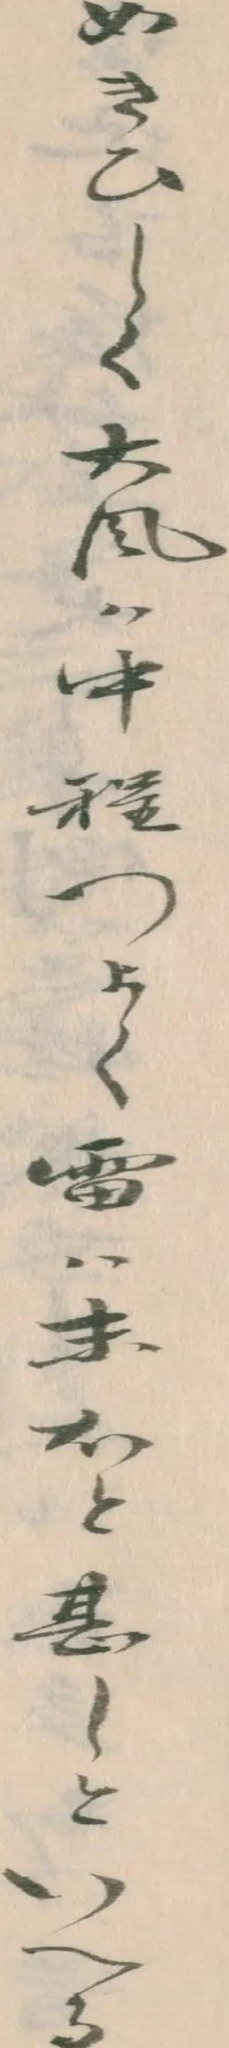めきひしく大風は中程つよく雷は末ほと甚しといへる
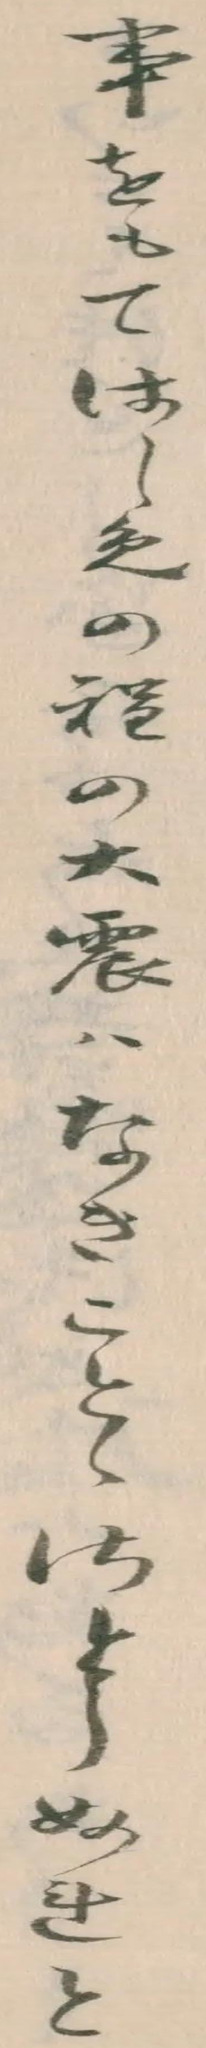事をもてはしめの程の大震はなきことゝさとしぬれと
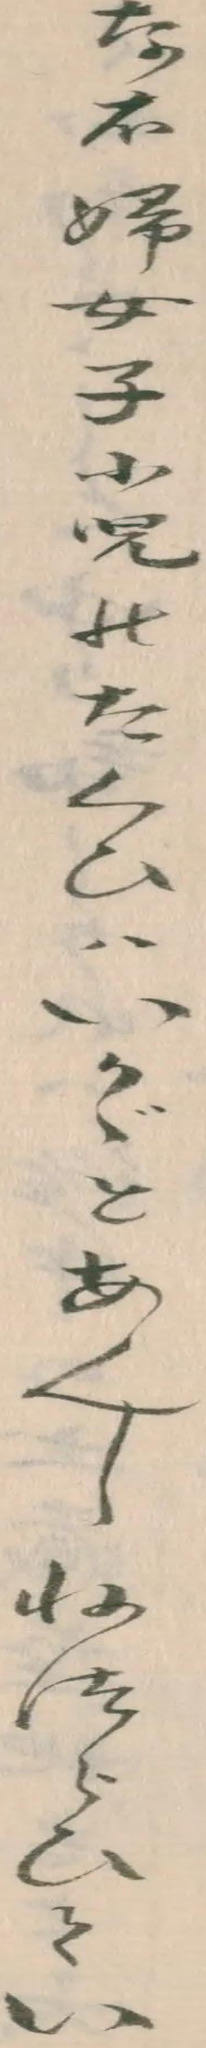なほ婦女子小児のたくひはいかゞとあんしわつらひてい
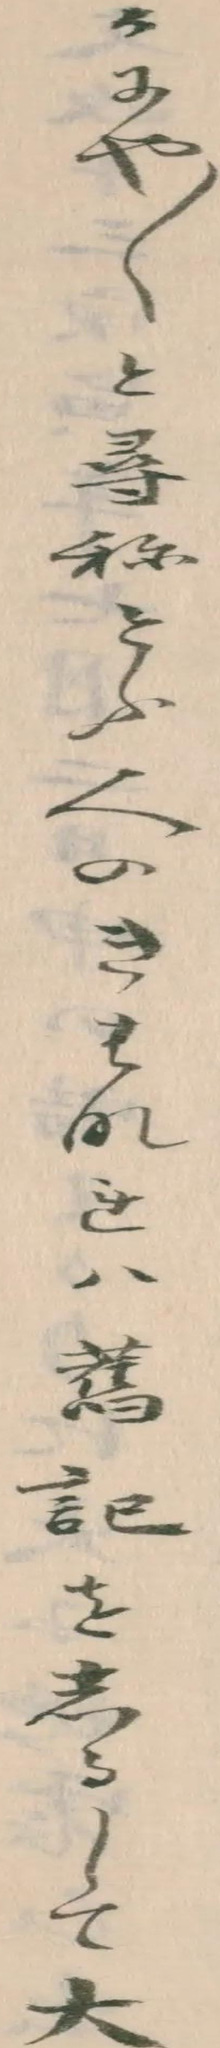かにや〳〵と尋ねとふ人のきはなれは旧記をしるして大
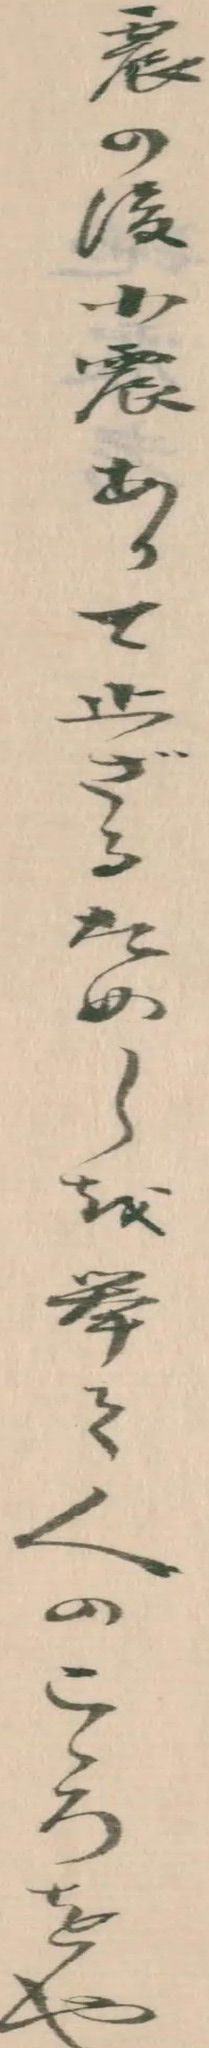震の後小震ありて止ざるためしを挙て人のこゝろをや
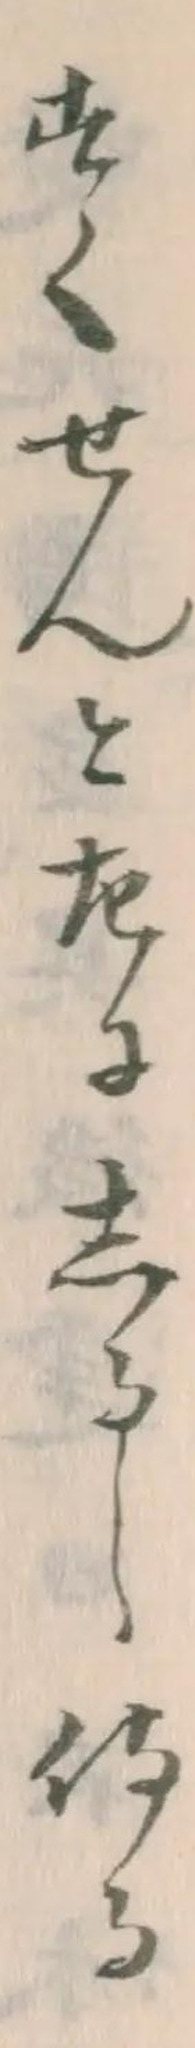すくせんと左にしるし侍る
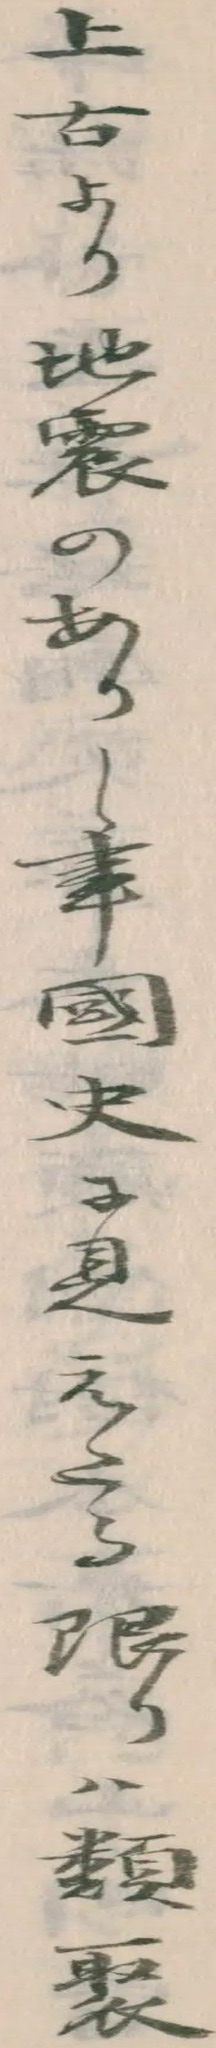上古より地震のありし事国史に見えたる限りは類聚
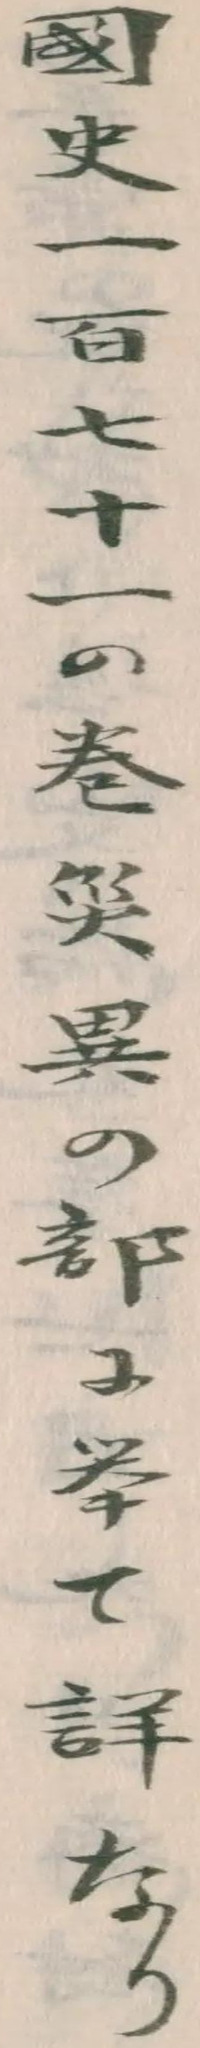国史一百七十一の巻災異の部に挙て詳なり
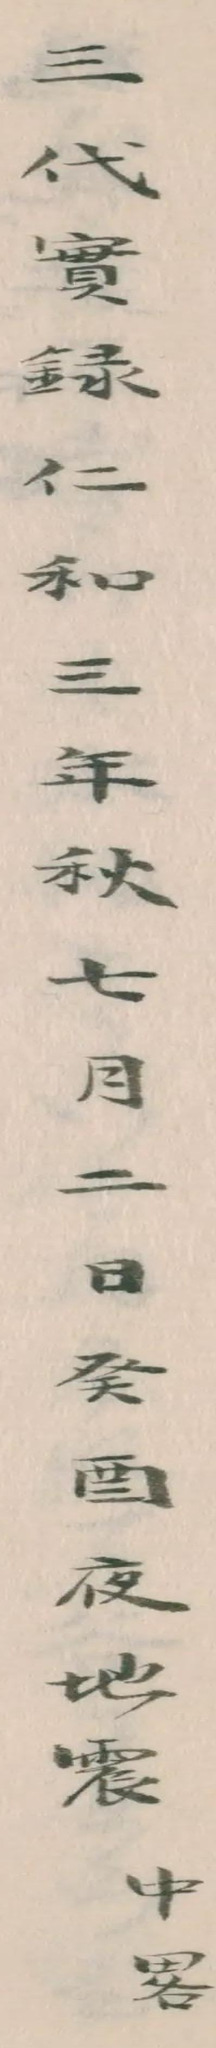三代実録仁和三年秋七月二日癸酉夜地震中略

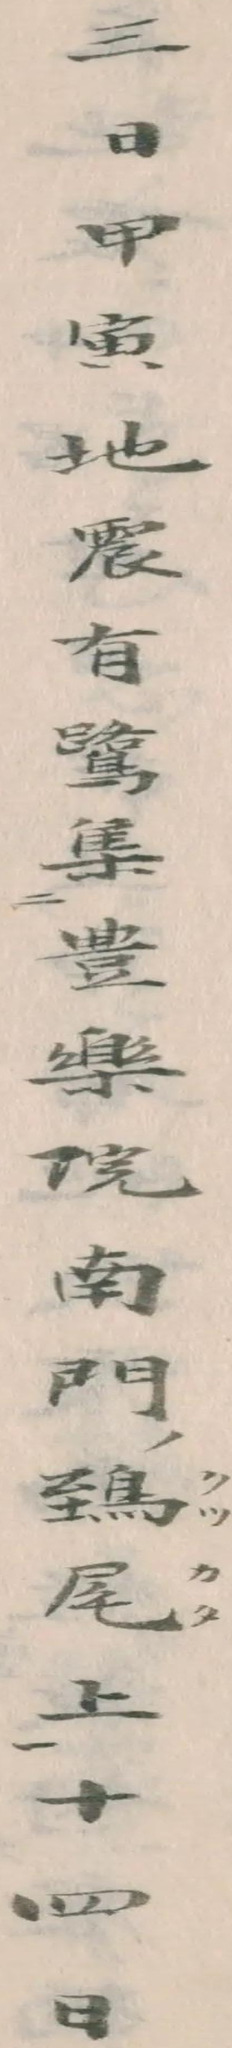三日甲寅地震有鷺集豊楽院南門鵄尾上十四日
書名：地災撮要. 巻11-12(地震之部)
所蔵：国立国会図書館 National Diet Library, JAPAN
